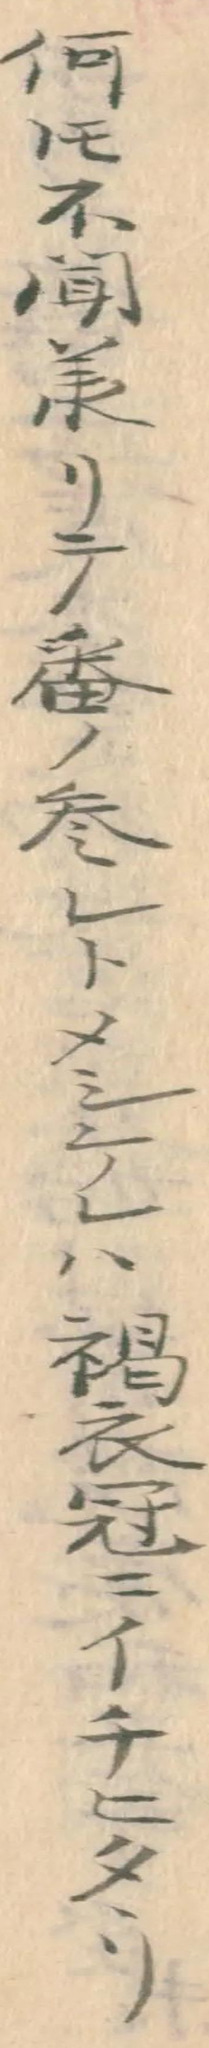何トモ不聞承リテ番ノ参レトメシケレハ褐衣冠ニイチヒタリ
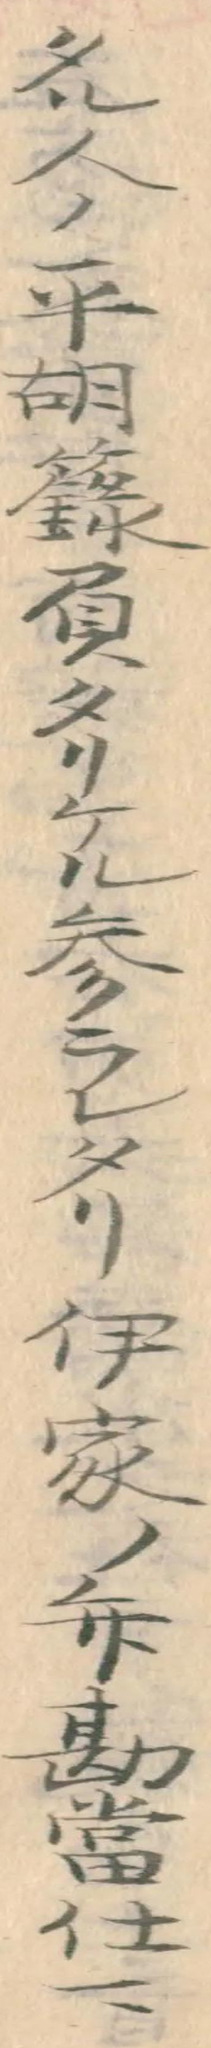タル人ノ平胡籙負タリケル参ラレタリ伊家ノ弁勘当仕マ
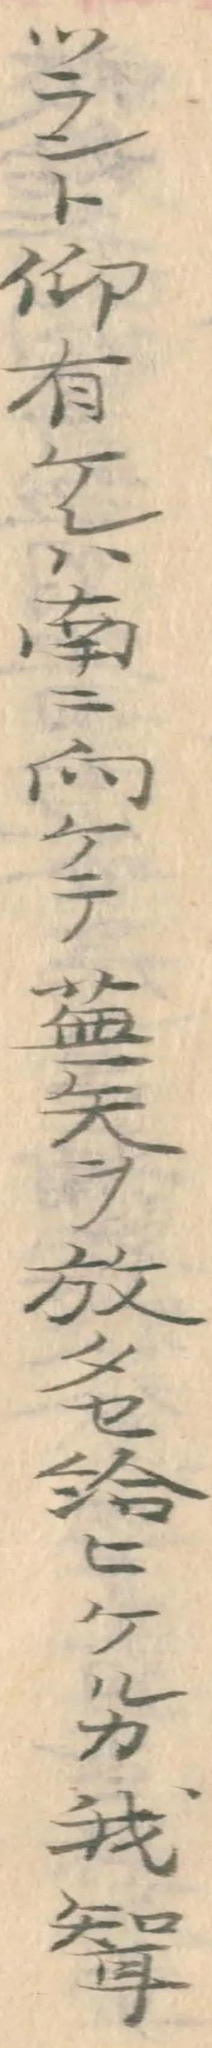ツラント仰有ケレハ南ニ向ケテ蕪矢ヲ放タセ給ヒケルカ我聟
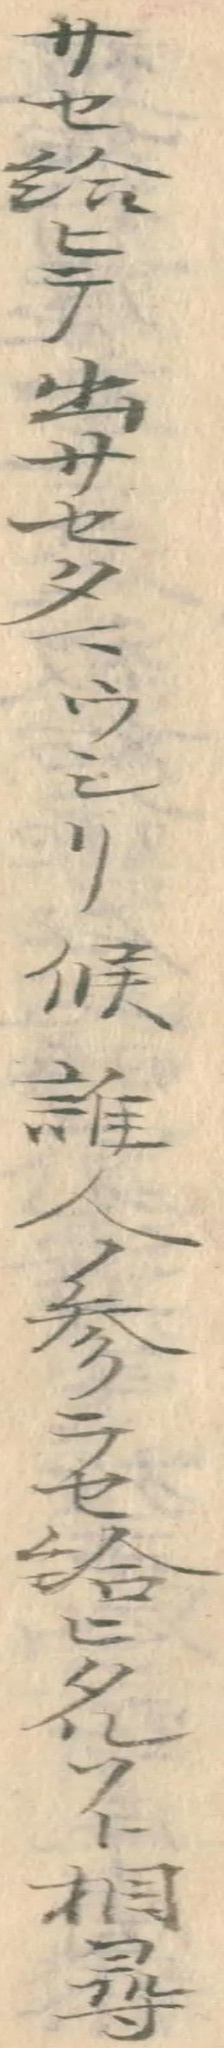サセ給ヒテ出サセタマウシリ候誰人ノ参ラセ給ヒタルソト相尋
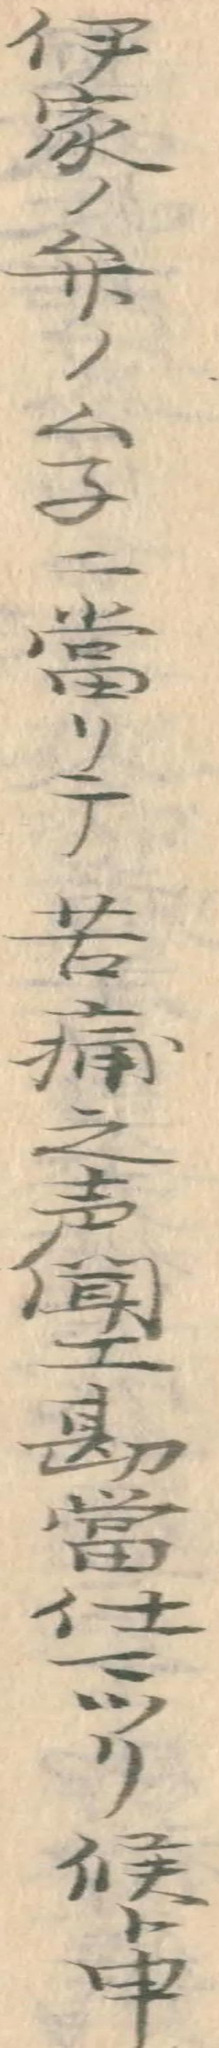伊家ノ弁ノム子ニ当リテ苦痛之声聞エ勘当仕マツリ候ト申
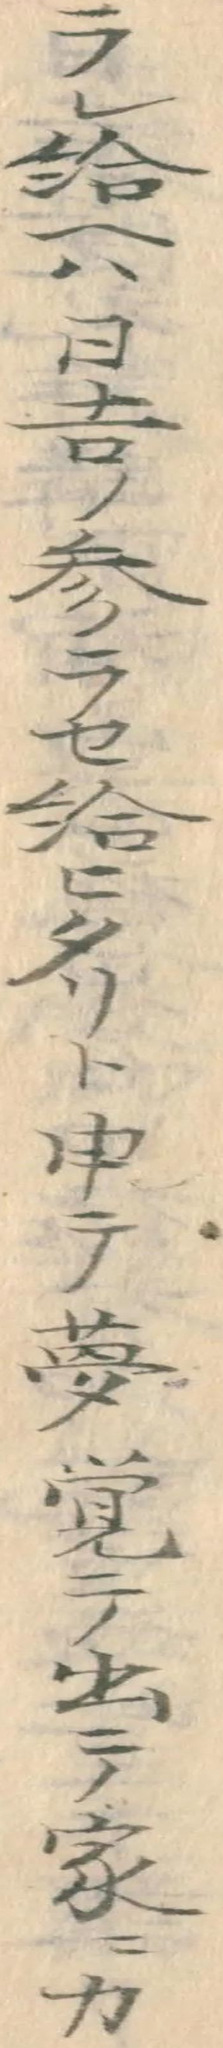ラレ給ヘハ日吉ノ参ラセ給ヒタリト申テ夢覚テ出テ家ニカ
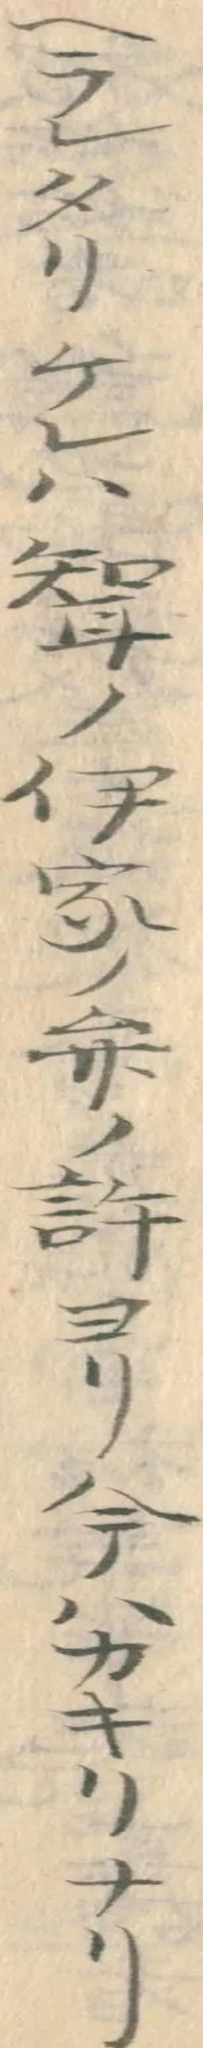ヘラレタリケレハ聟ノ伊家ノ弁ノ許ヨリ今ハカキリナリ
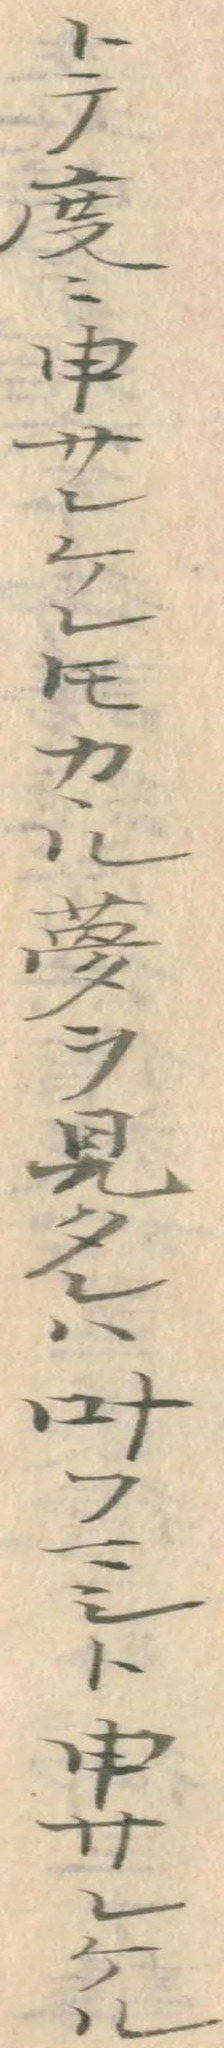トテ度ニ申サレケレトモカヽル夢ヲ見タレハ叶フマシト申サレケル
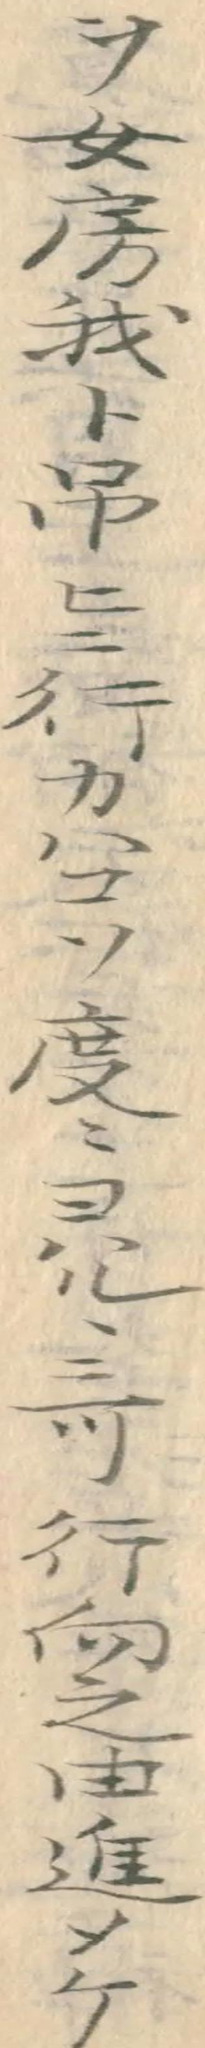ヲ女房我ト吊ヒニ行カハコソ度々ヨハルヽニ可行向之由進メケ
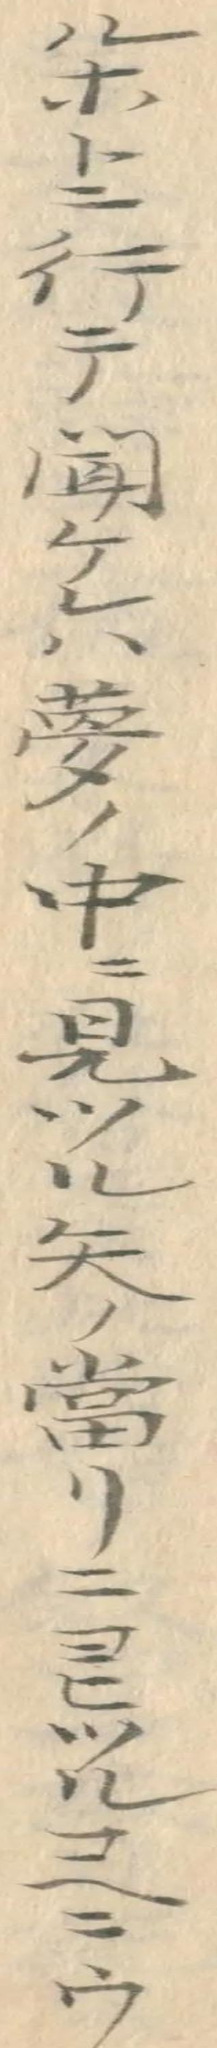ルホトニ行テ聞ケレハ夢ノ中ニ見ツル矢ノ当リニヨヒツルコヘニウ
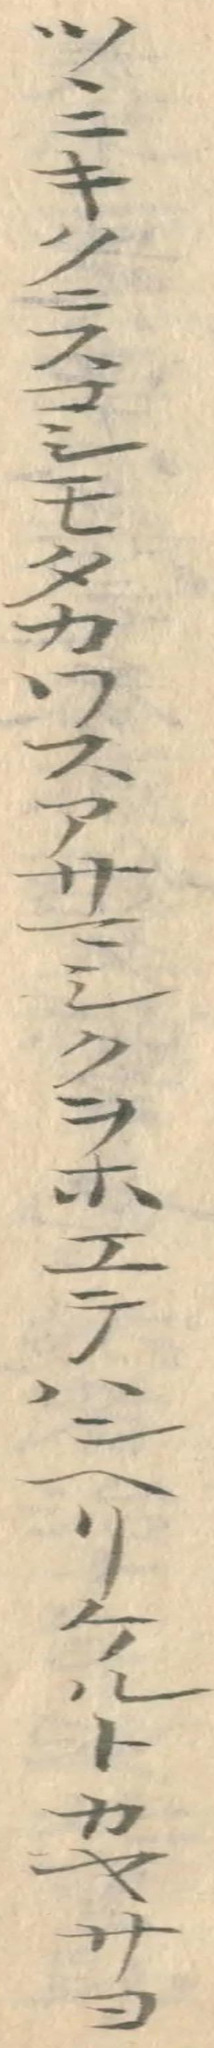ツヽニキクニスコシモタカワスアサマシクヲホエテハンヘリケルトカヤサヨ
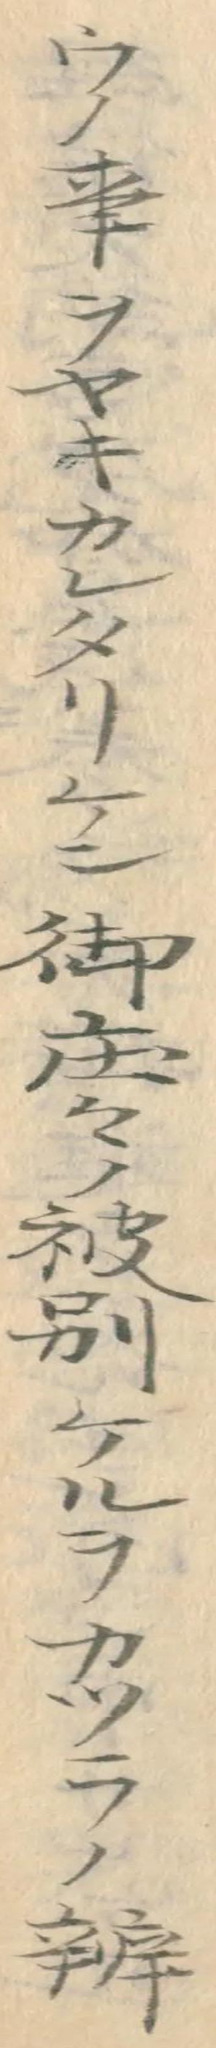ウノ事ヲヤキカレタリケン御庄々ノ被別ケルヲカツラノ弁

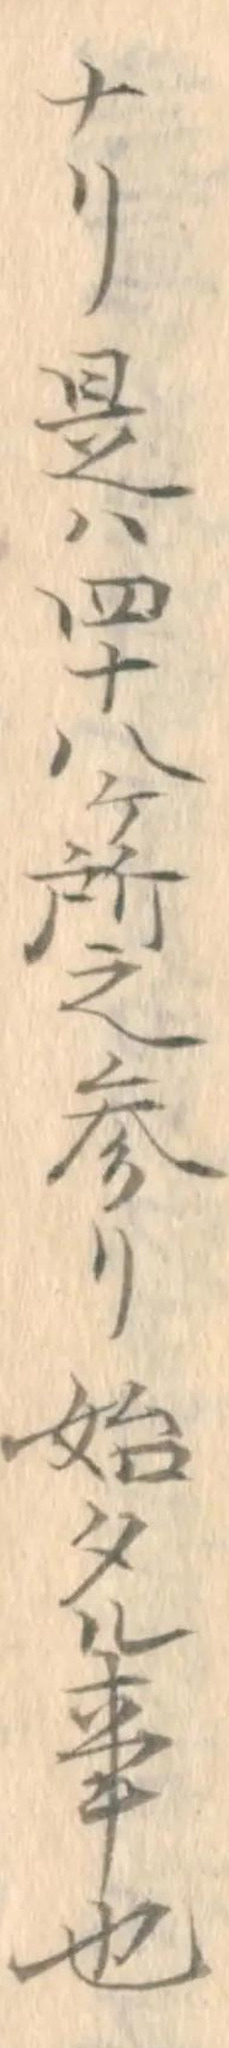ナリ是ハ四十八ケ所之参リ始タル事也
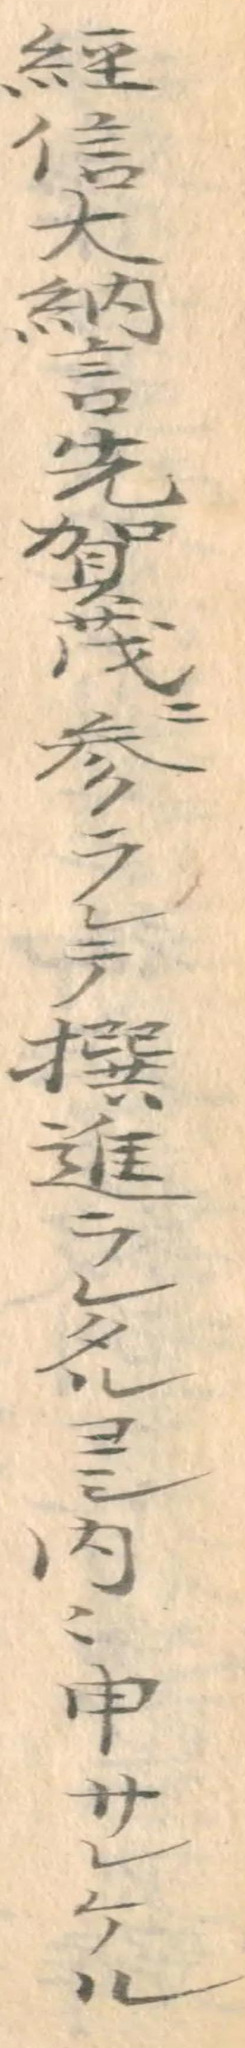経信大納言先賀茂ニ参ラレテ撰進ラレタルヨシ内々申サレケル
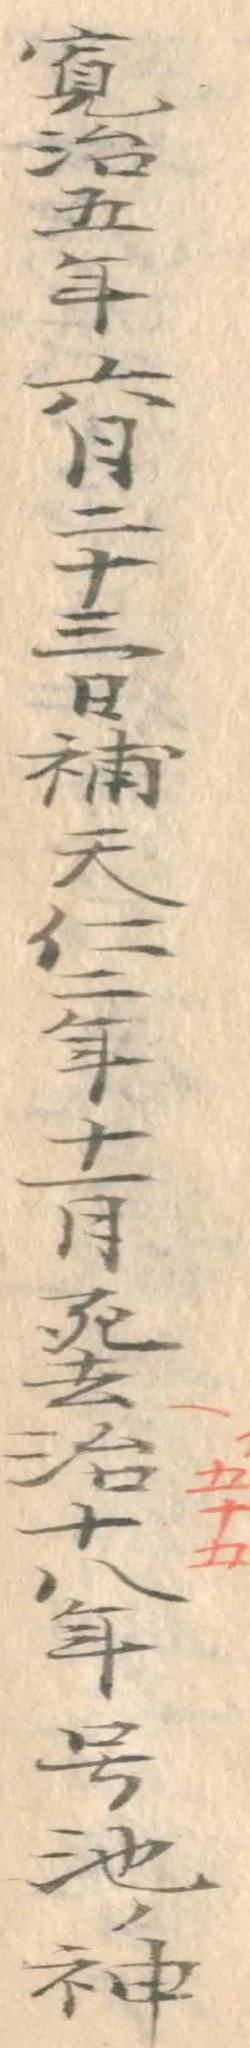成継寛治五年六月二十三日補天仁二年十一月死去治十八年号池ノ神
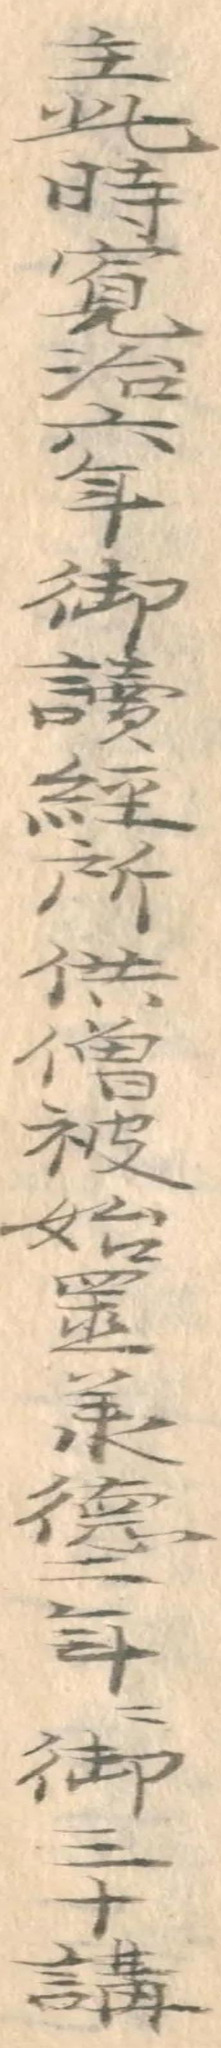主此時寛治六年御読経所供僧被始置承徳二年ニ御三十講
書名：賀茂社記録. 第24冊
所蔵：国立国会図書館 National Diet Library, JAPAN
